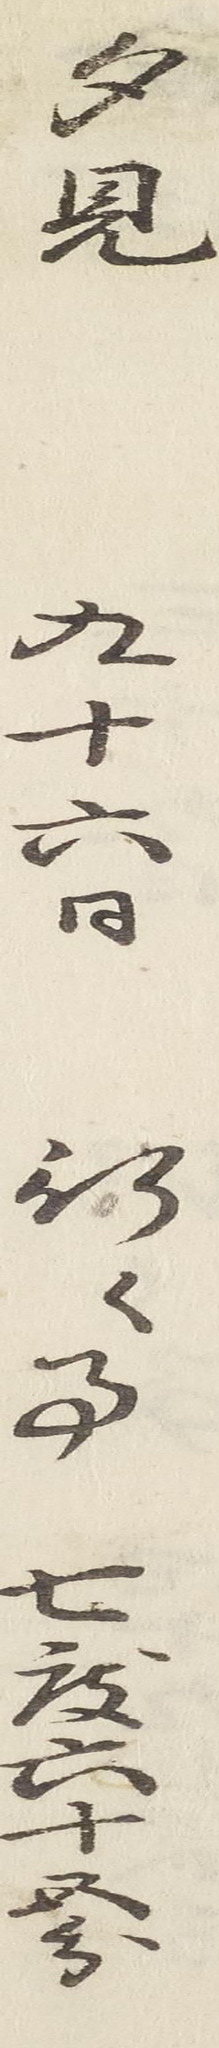夕見九十六日行く事七度六十五分
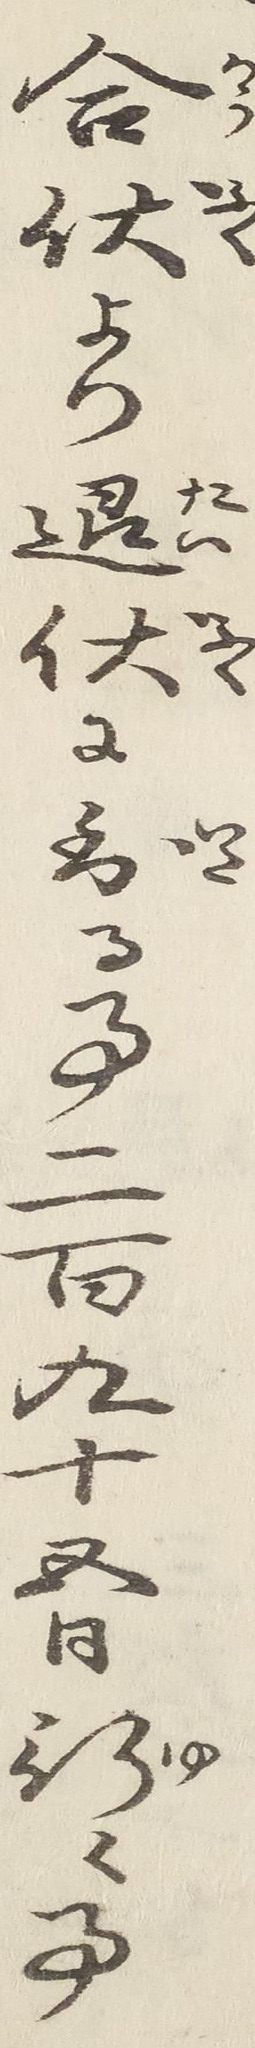合伏より退伏に到る事二百九十五日行く事
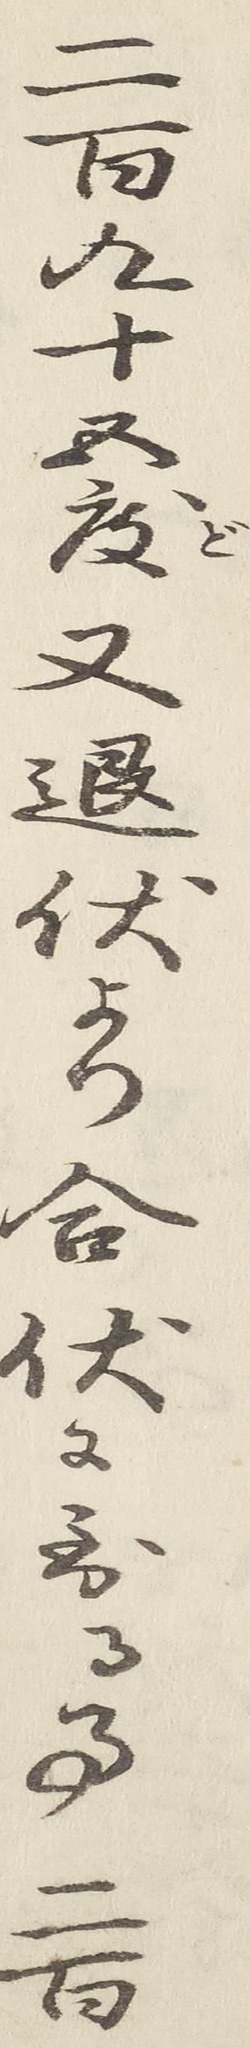二百九十五度又退伏より合伏に到る事二百
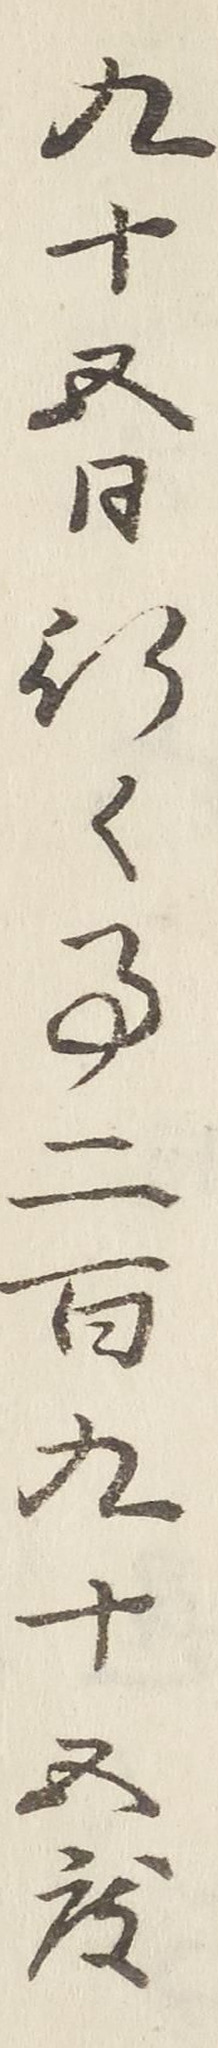九十五日行く事二百九十五度
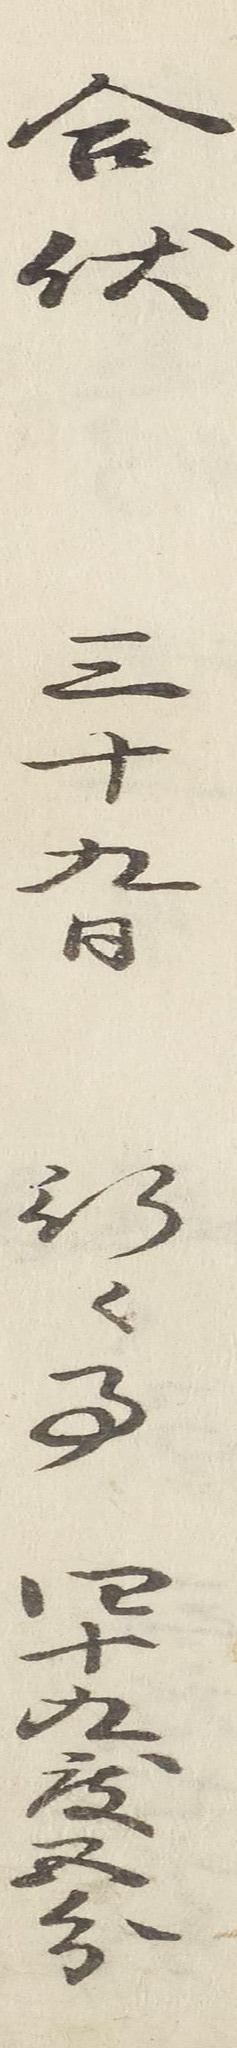合伏三十九日行く事四十九度五分

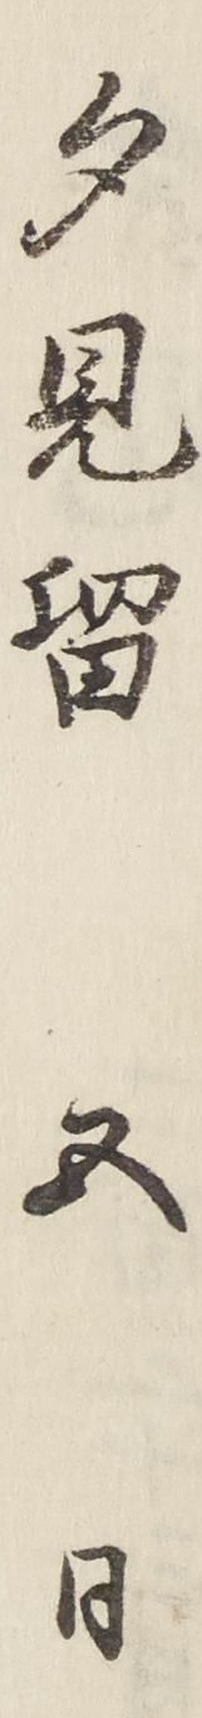夕見留五日
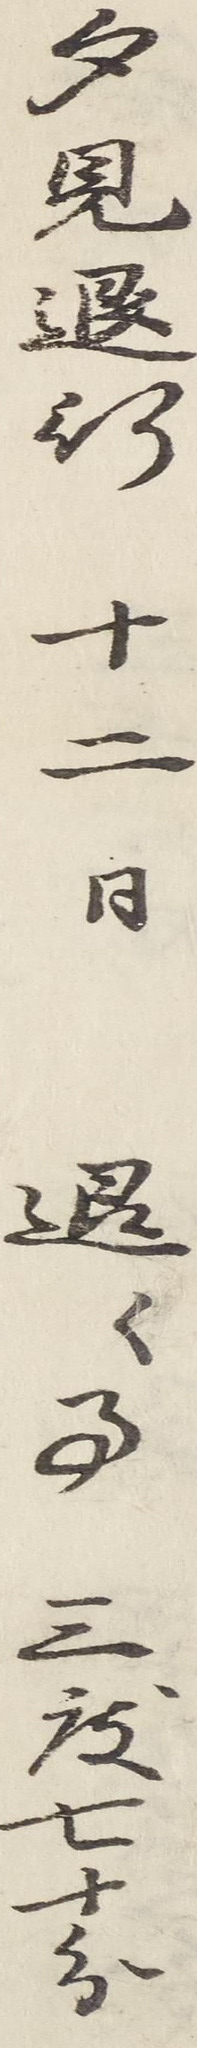夕見退行十二日退く事三度七十分
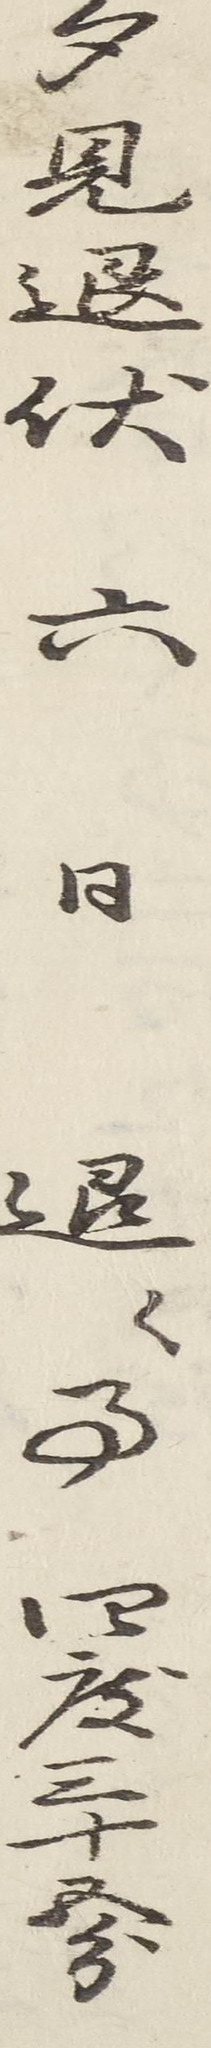夕見退伏六日退く事四度三十五分
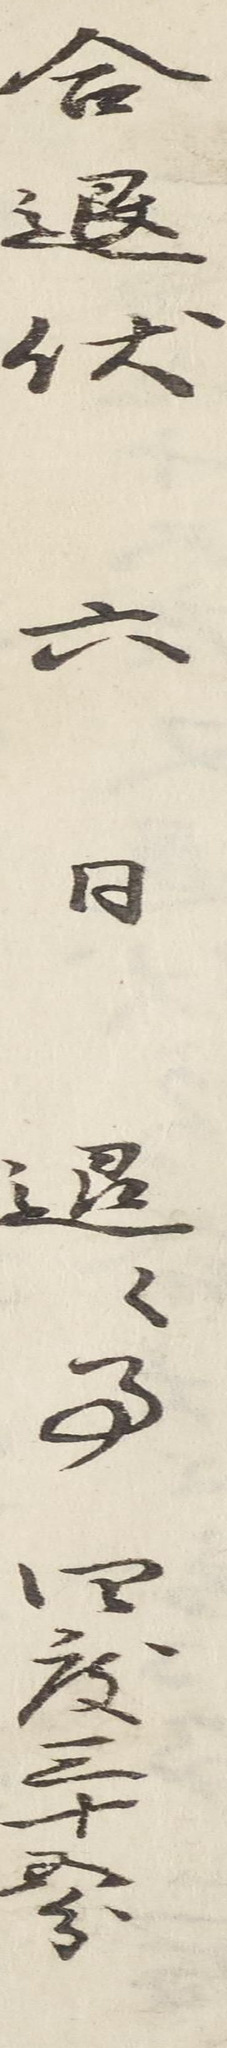合退伏六日退く事四度三十五分
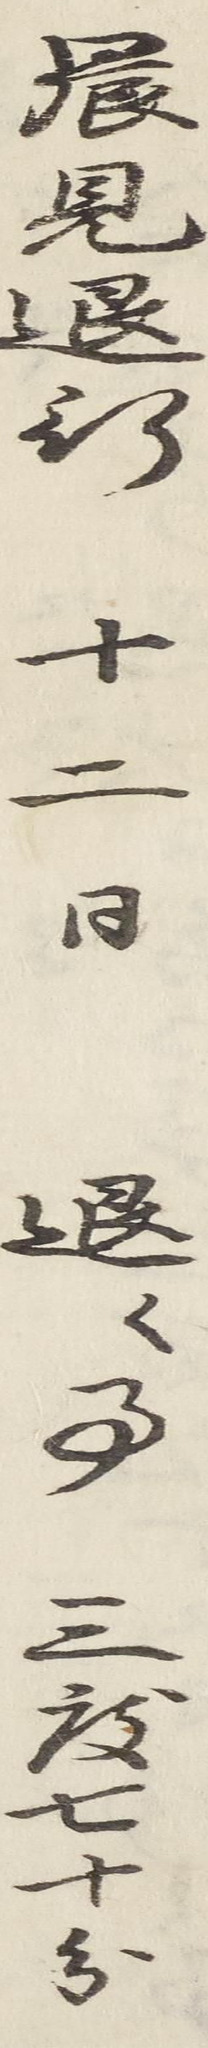晨見退行十二日退く事三度七十分
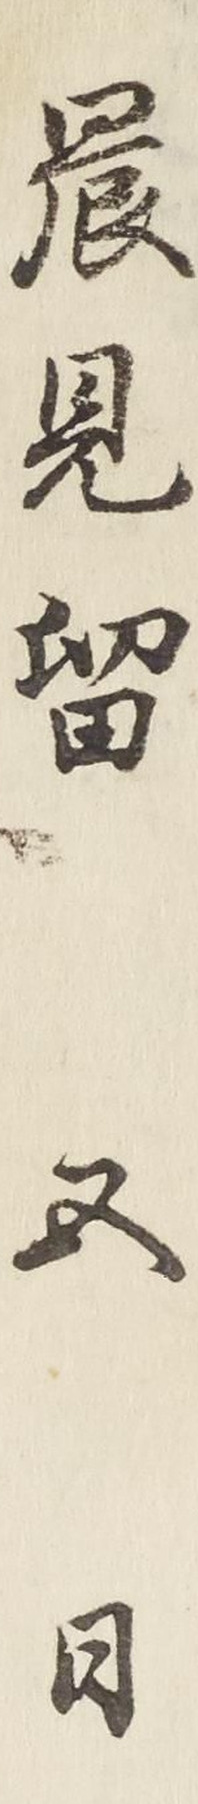晨見留五日
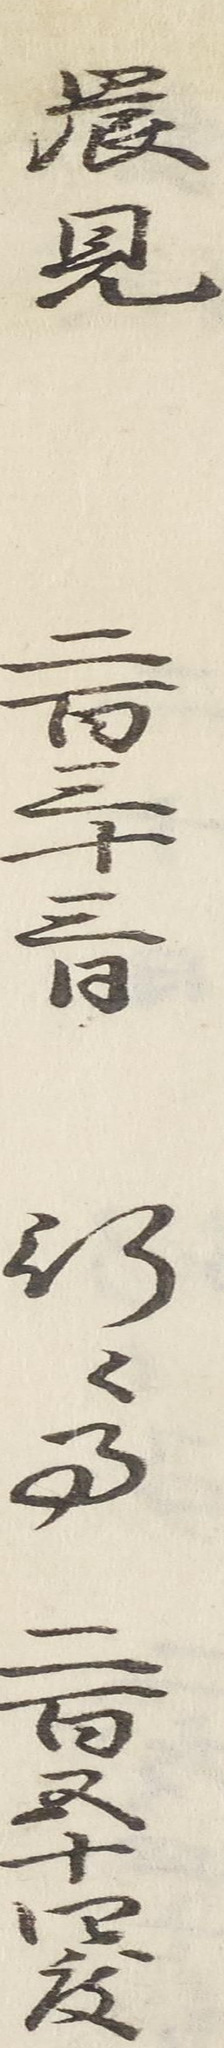晨見二百三十三日行く事二百五十四度
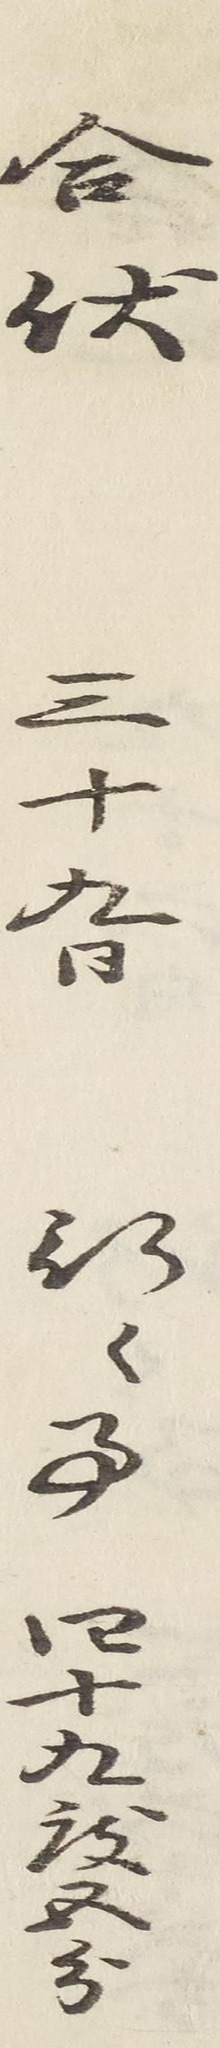合伏三十九日行く事四十九度五分
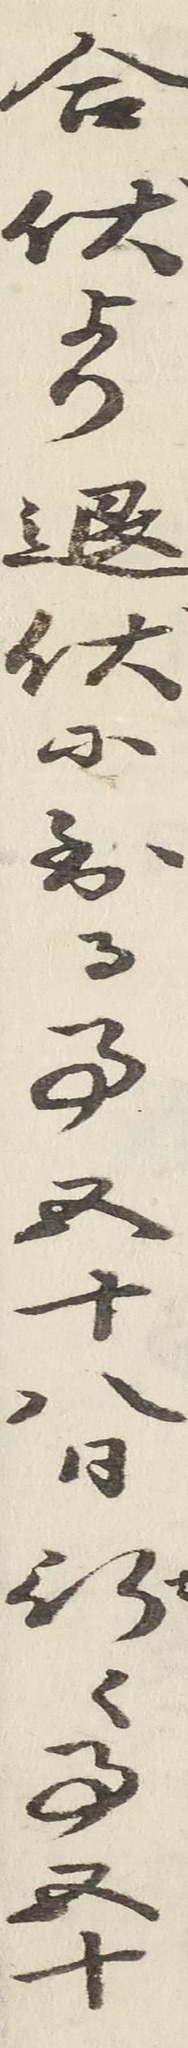合伏より退伏に到る事五十八日行く事五十
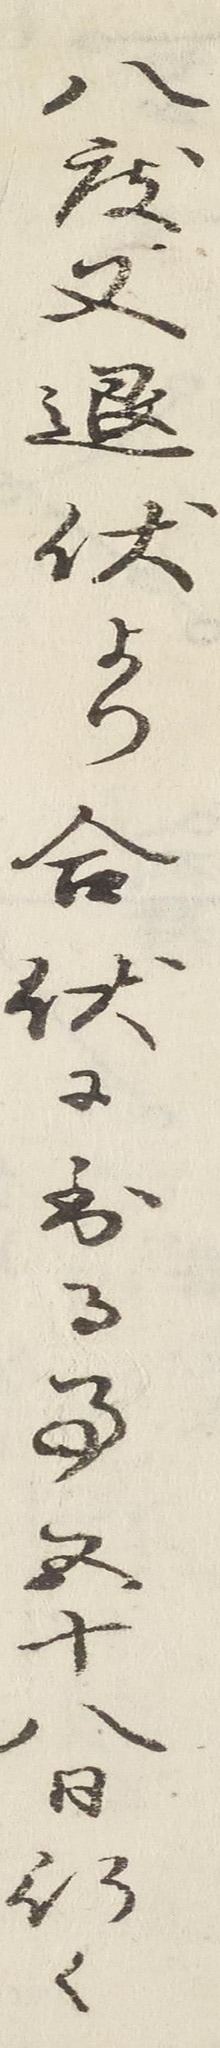八度又退伏より合伏に到る事五十八日行く
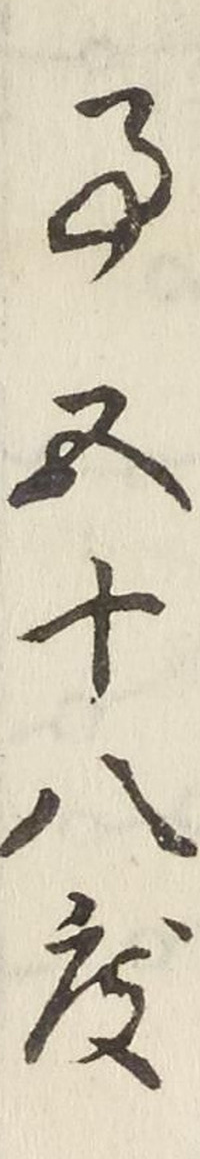事五十八度
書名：平天儀圖解
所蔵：東京大学地震研究所図書室 Earthquake Research Institute Library, The University of Tokyo, JAPAN
